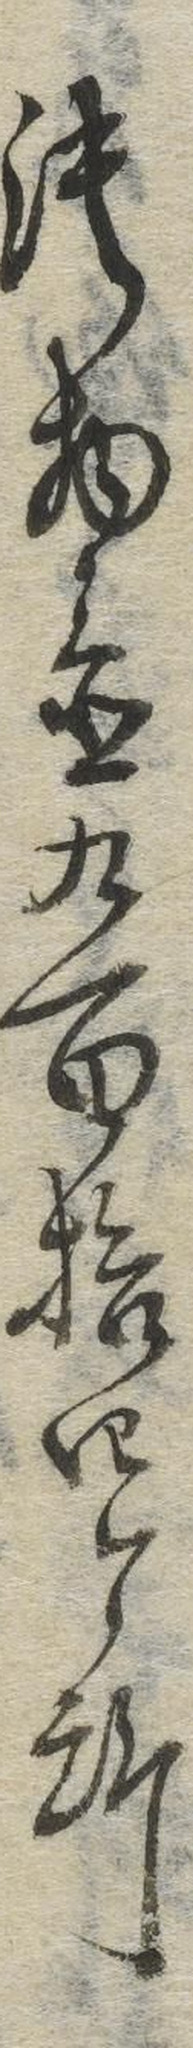潰物置九百拾四ヶ所
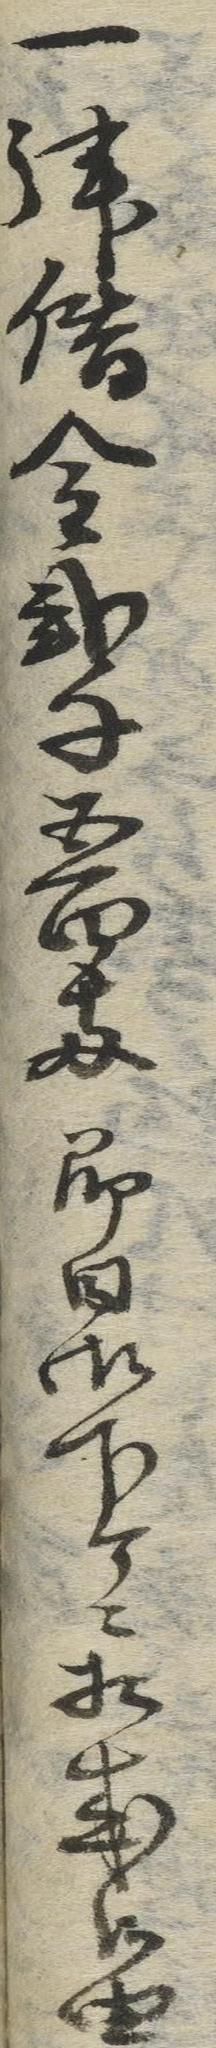一拝借金弐千五百両即日御下ヶ相成候由
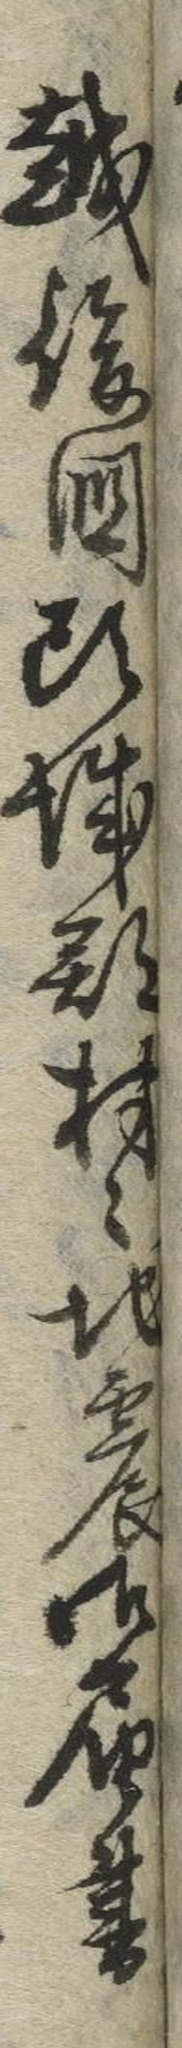越後国頸城郡村々地震御届書
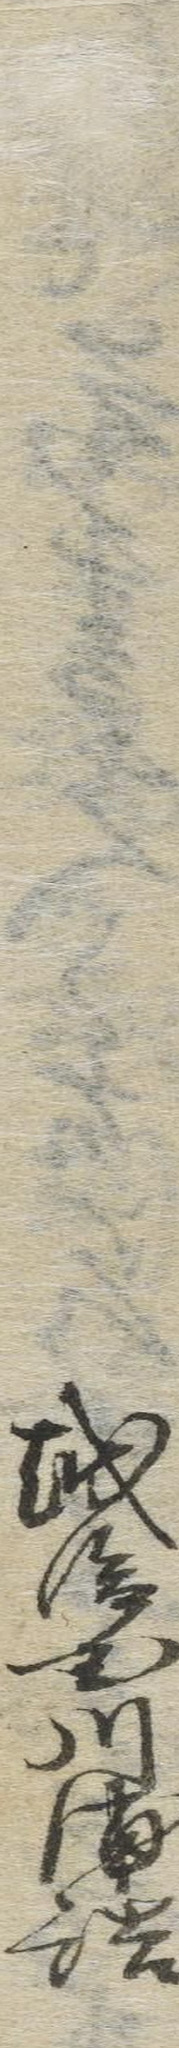越後国川浦詰
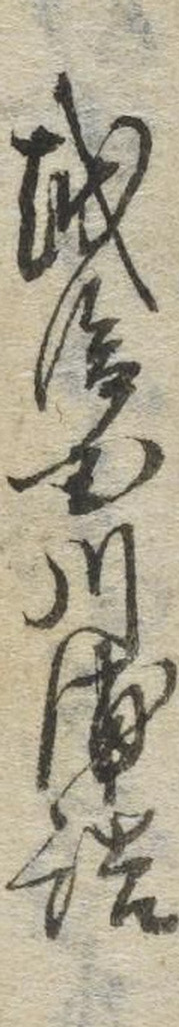越後国川浦詰
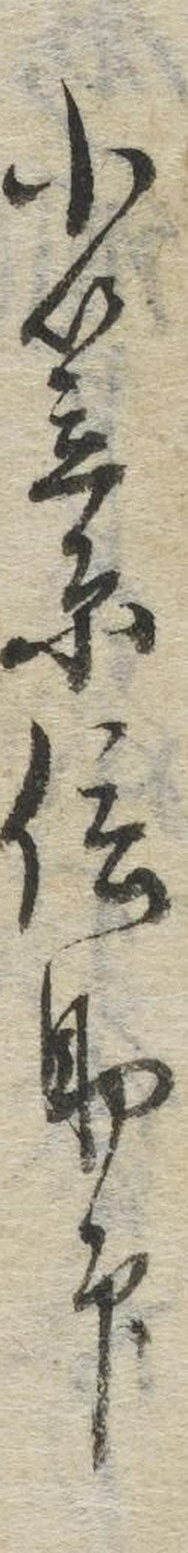小笠原信助印
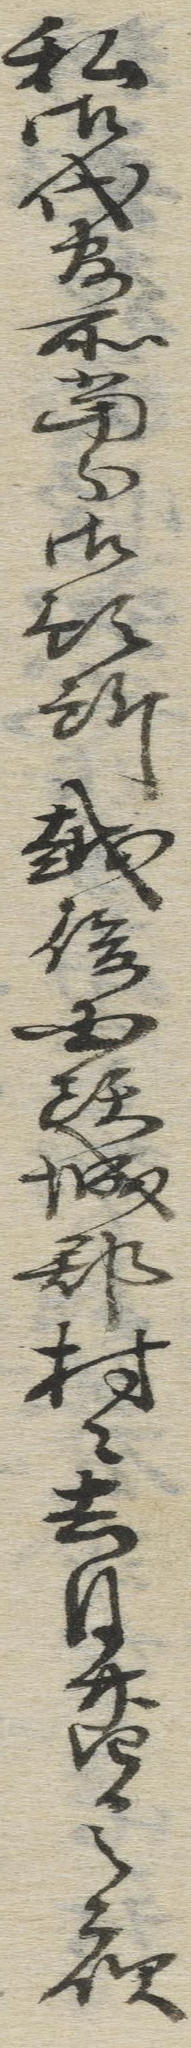私御代官所当分御預所越後国頸城郡村々去月廿四日之夜
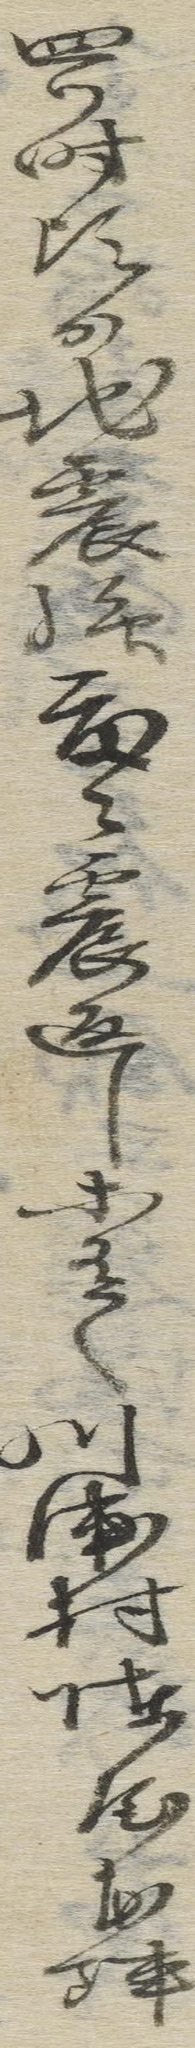四ッ時頃ゟ地震強度々震返し等有之川浦村陣屋本陣
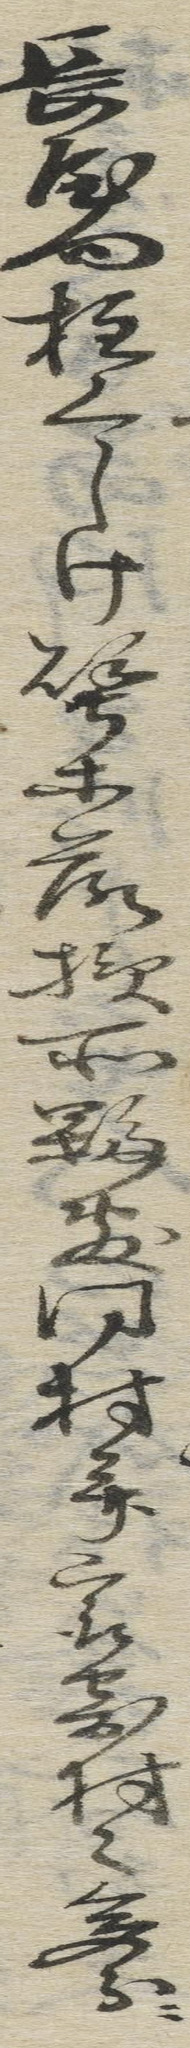長屋向柱くしけ壁等落損所夥敷同村并最寄村々ハ多分二
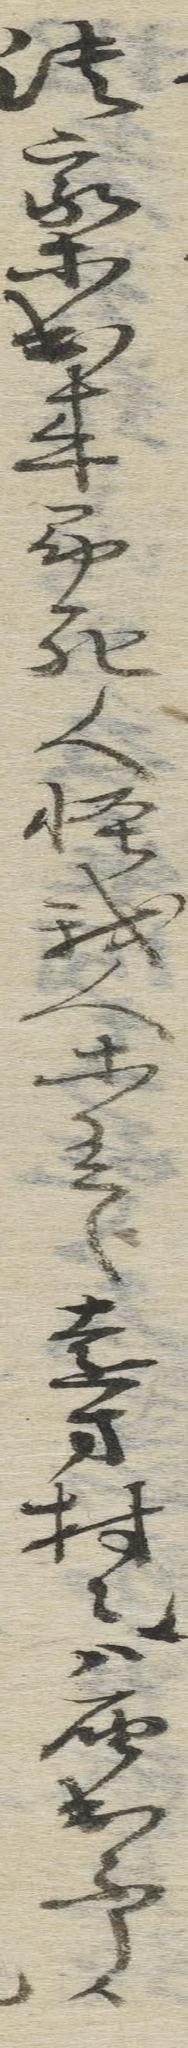潰家等出来即死人怪我人等有之遠方村々ハ届出不申候
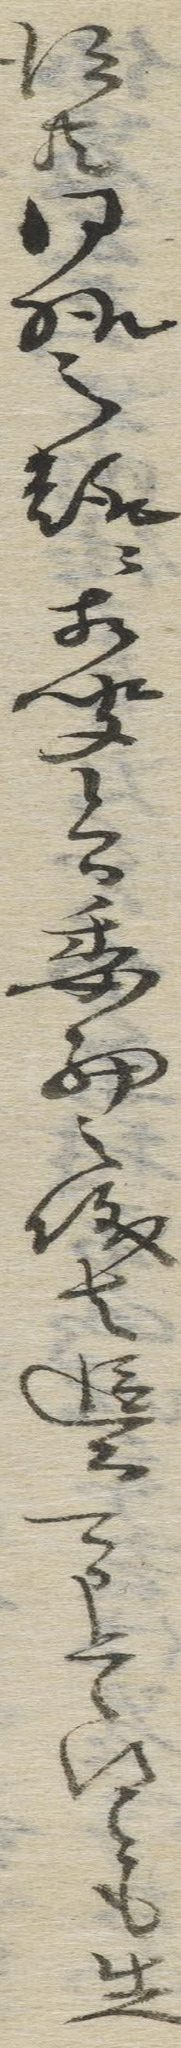得共同様之趣二相聞候間委細之儀は追而可申上候得とも先
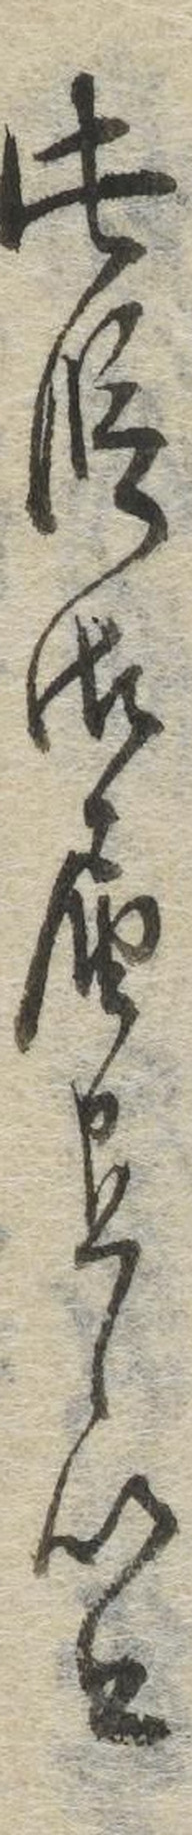此段御届申上候以上
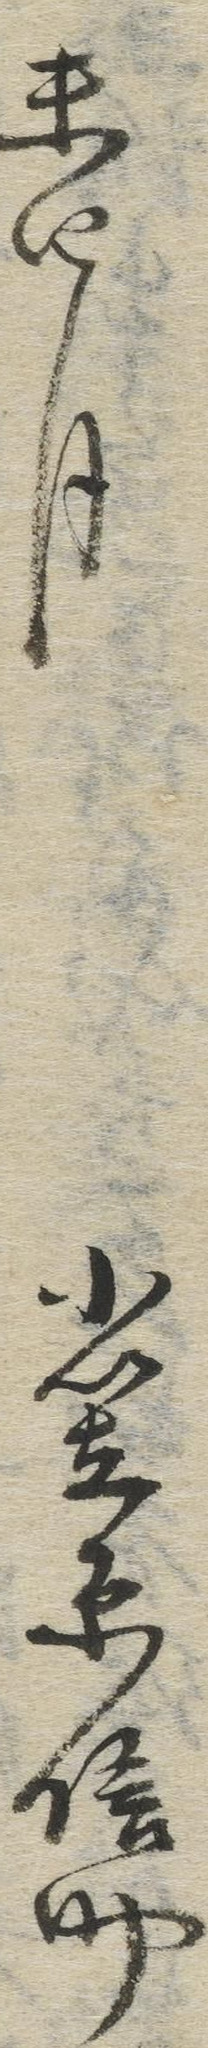未四月小笠原信助
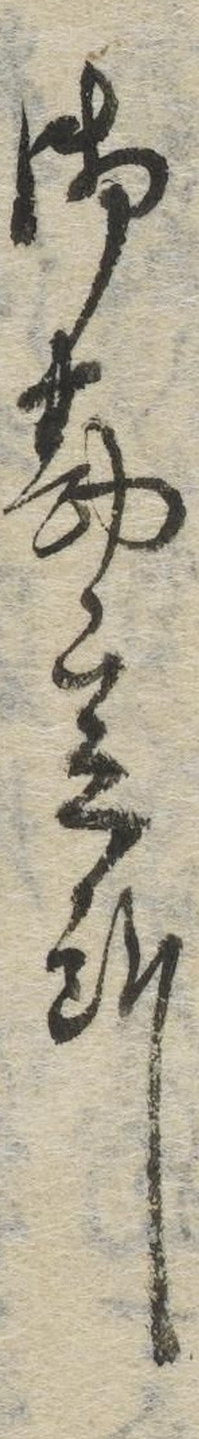御勘定所
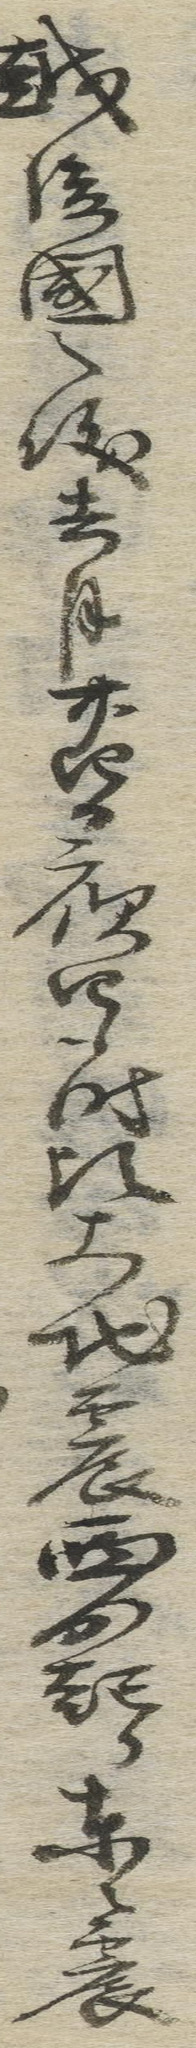越後国之儀去月廿四日夜四ッ時頃大地震西ゟ起り東二震
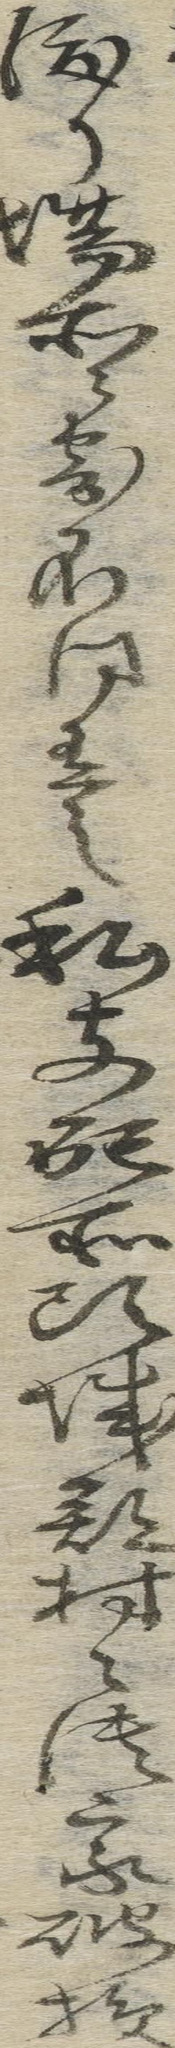渡り場所二寄不同有之私支配所頸城郡村々潰家破損
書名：信濃越後　地震書留
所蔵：東京大学地震研究所図書室 Earthquake Research Institute Library, The University of Tokyo, JAPAN
